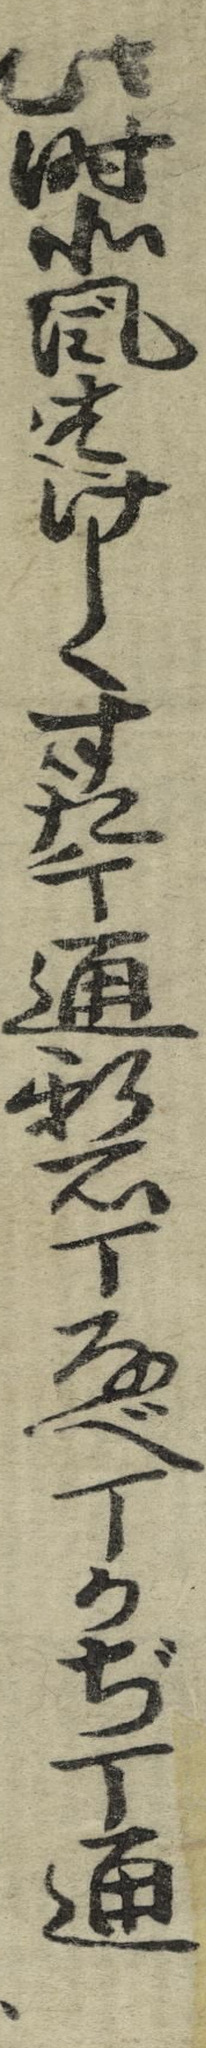此時北風はけしくすた丁通新石丁なべ丁かぢ丁通り
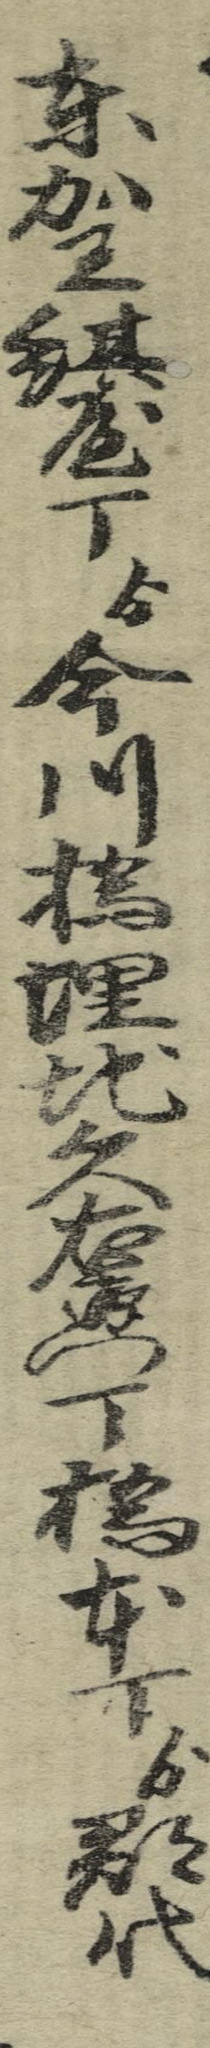東かわ紺屋丁ゟ今川橋埋地久右衛門丁橋本丁ゟ郡代
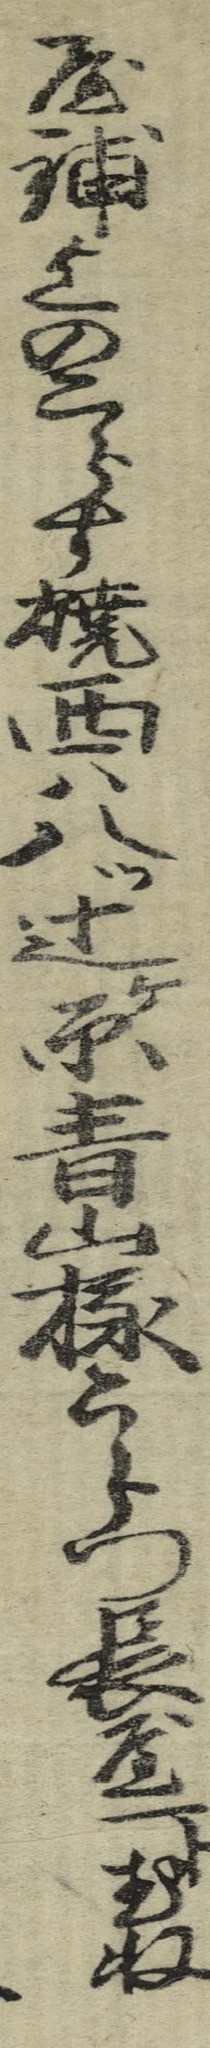屋鋪迄のこらす焼西は八ツ辻ケ原青山様うら門長屋一ㇳむね
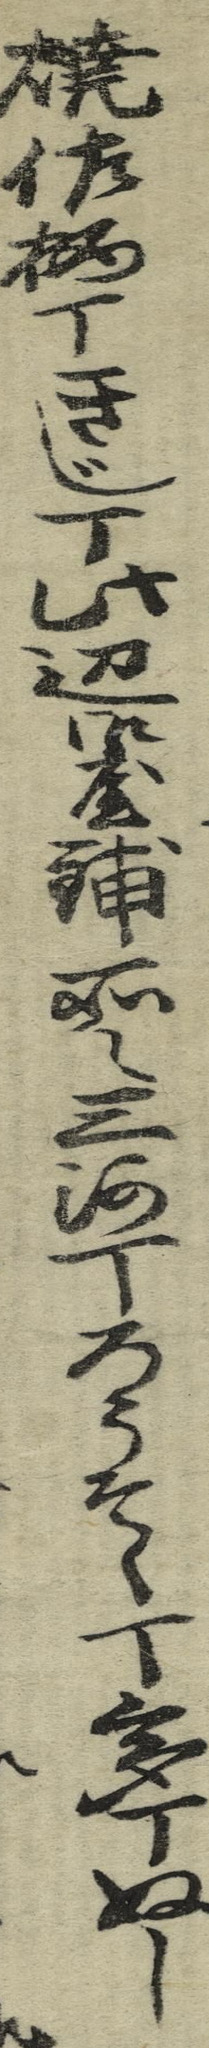焼佐柄丁きじ丁此辺御屋鋪所々三河丁ろうそく丁多丁ぬし
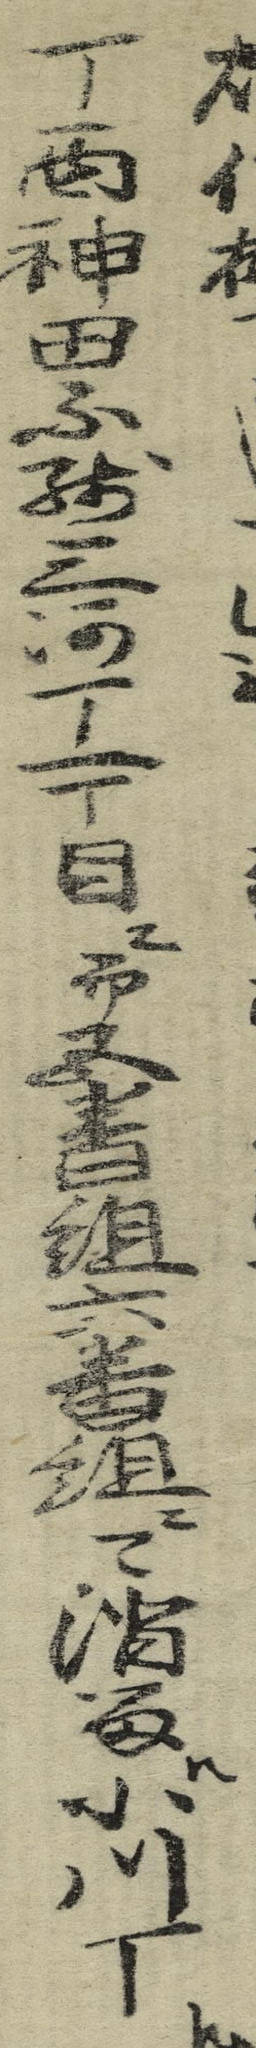丁西神田不残三河丁一丁目二而五番組六番組二て消留ル小川丁
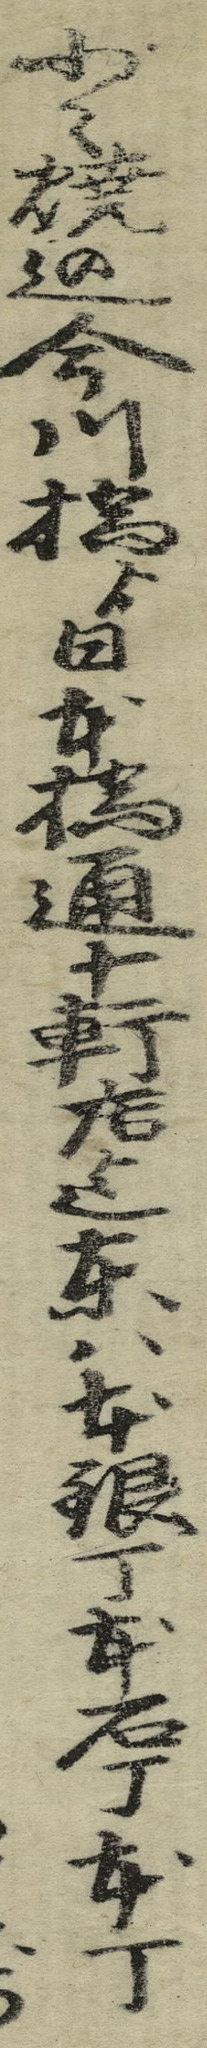小〻焼込今川橋ゟ日本橋通十軒店迄東は本銀丁本石丁本丁
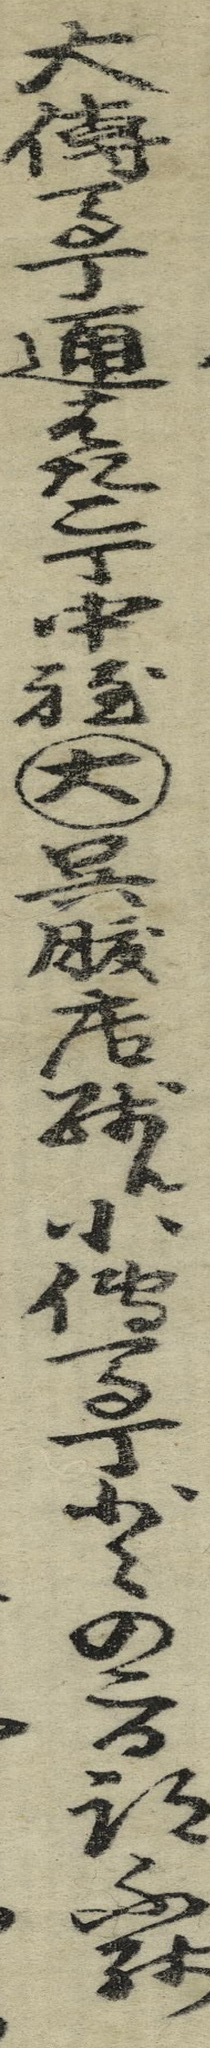大伝馬丁通はたこ丁中程大呉服店残ル小伝馬丁少〻のこる跡不残
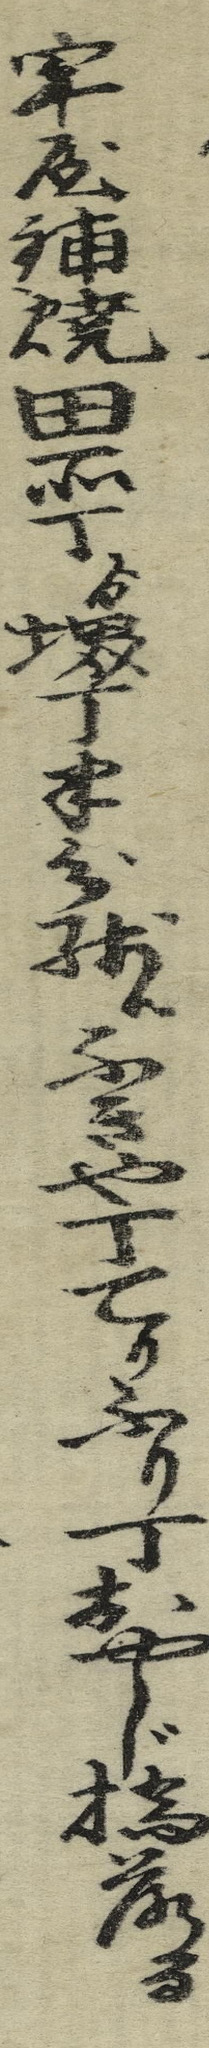牢屋鋪焼田所丁ゟ堺丁半分残ルふきや丁てりふり丁おやじ橋落る
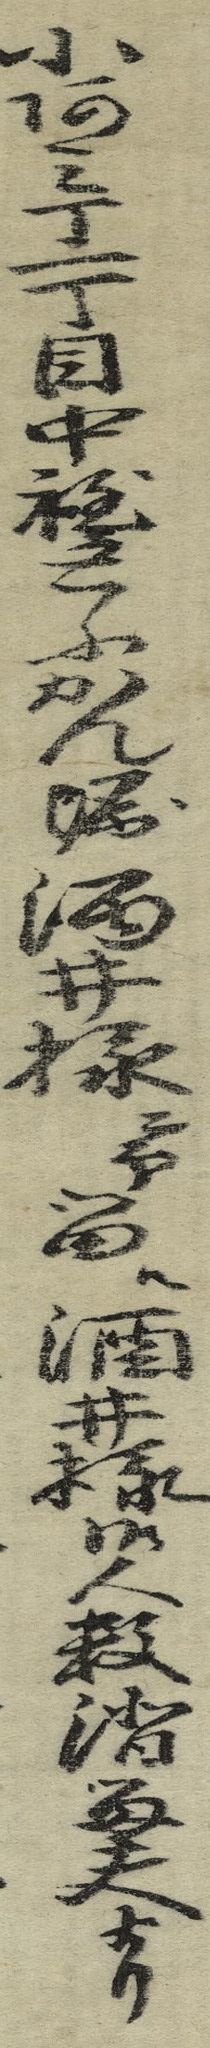小あみ丁一丁目中程とふかん堀酒井様二而留ル酒井様御人数消留夫より
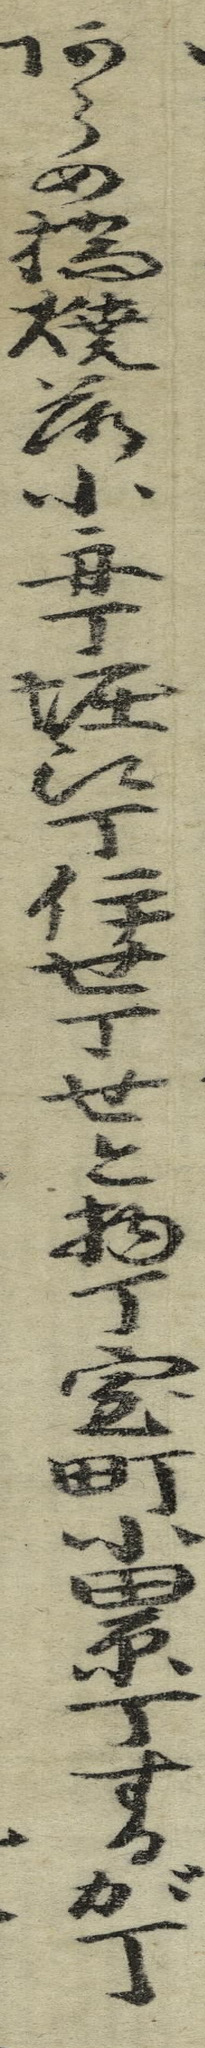あらめ橋焼落小舟丁堀江丁伊せ丁せと物丁宝町小田原丁するが丁
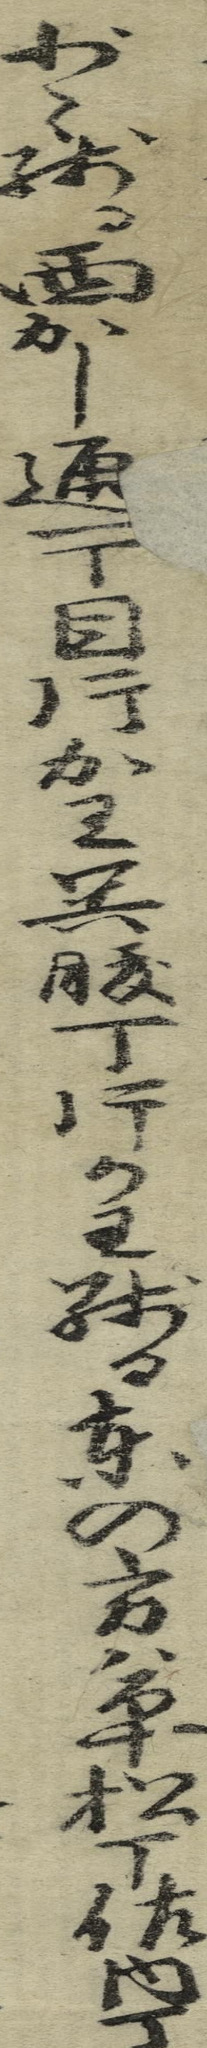少〻残る西かし通一丁目片かわ呉服丁片かわ残る東の方は平松丁佐内丁
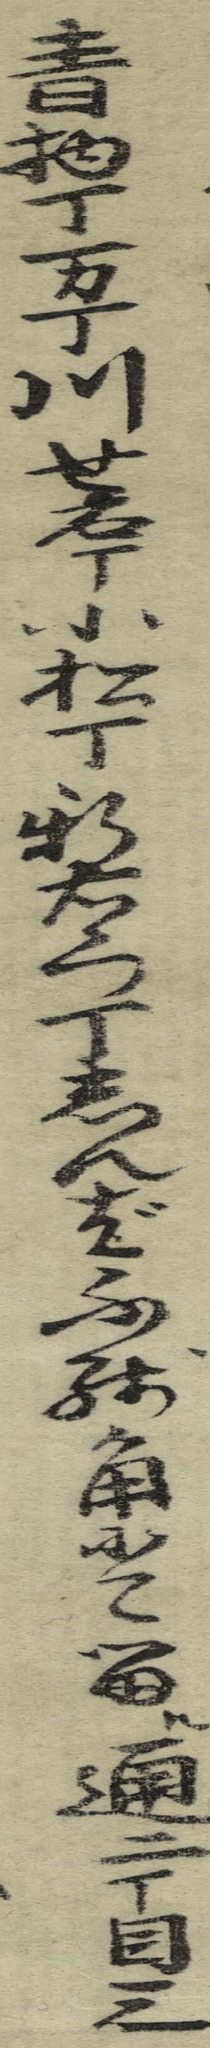青物丁万丁川せ石丁小松丁新右衛門丁しんば不残角にて留ル通二丁目三
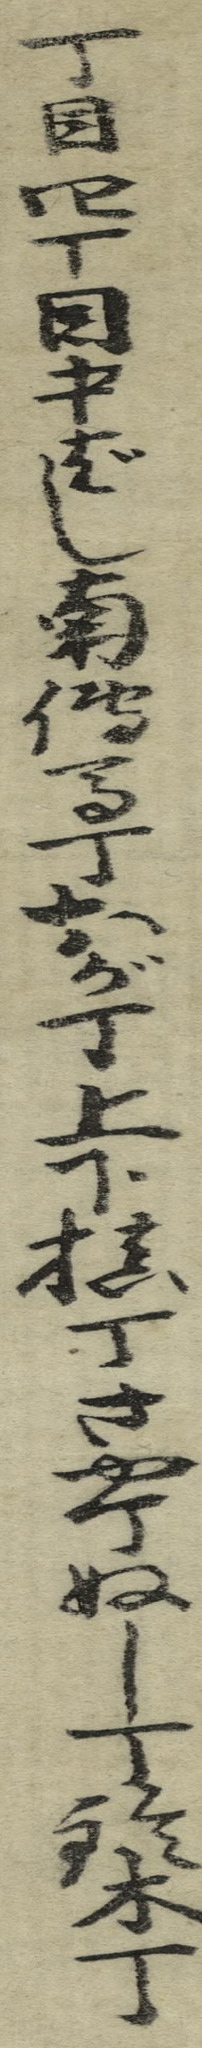丁目四丁目中ばし南伝馬丁おが丁上下槙丁さや丁ぬし丁鈴木丁
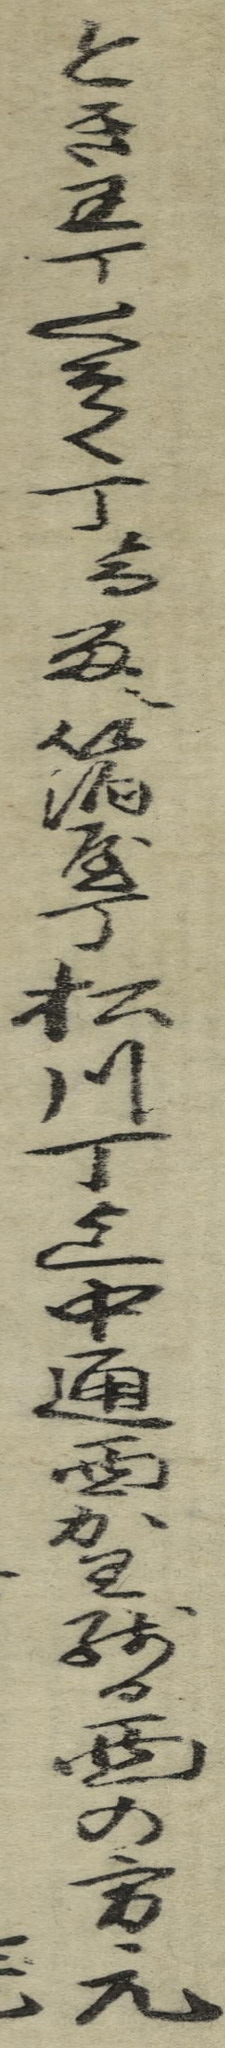ときわ丁くそく丁二而留ル箔屋丁松川丁迄中通両かわ残る西の方元
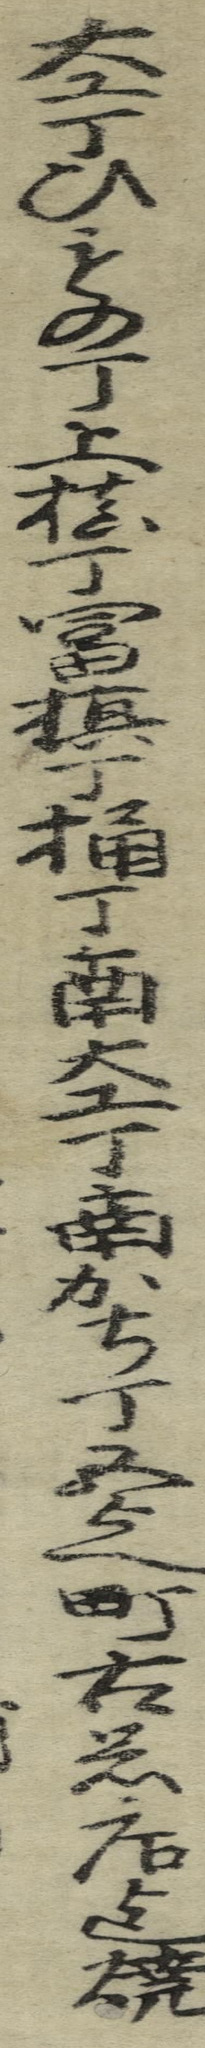大工丁ひもの丁上槙丁富槙丁桶丁南大工丁南かち丁五郎へ町古着店迄焼
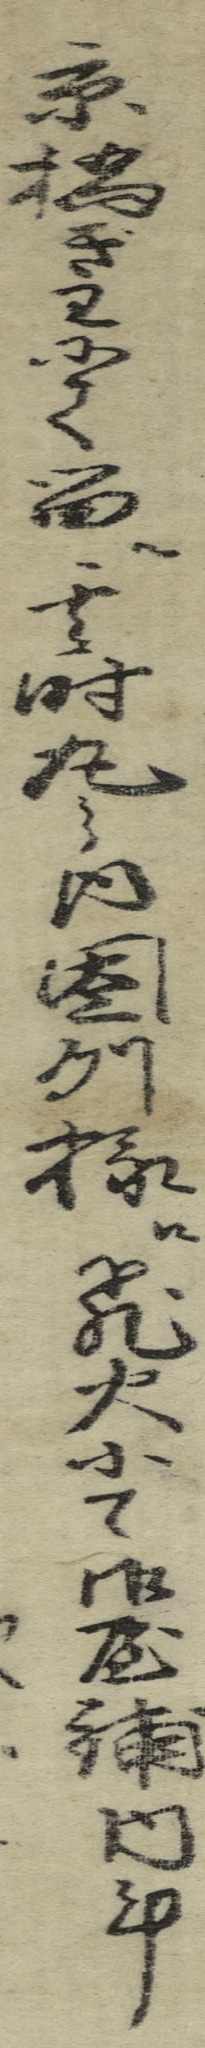京橋きわにて留ル其時丸之内因州様江飛火にて御屋鋪内斗
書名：安政五午十一月十五日焼場方角附
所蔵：東京大学地震研究所図書室 Earthquake Research Institute Library, The University of Tokyo, JAPAN
